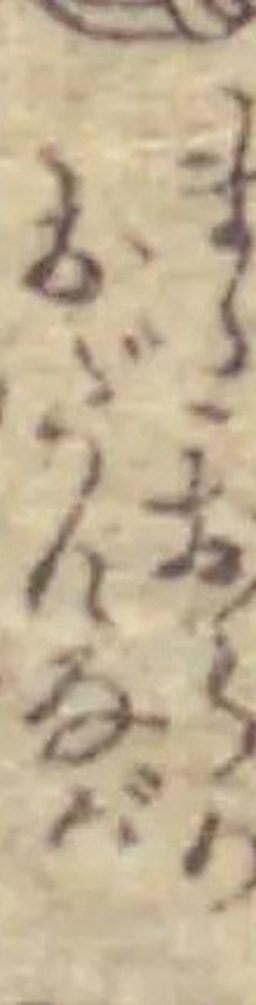おだんなが
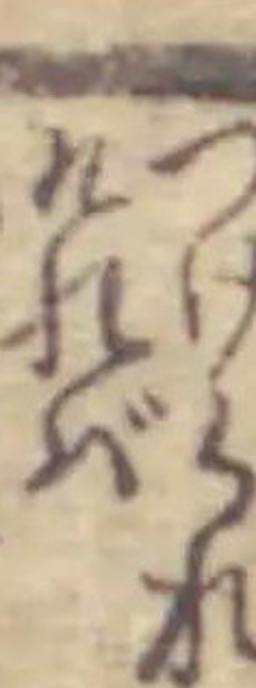ければ
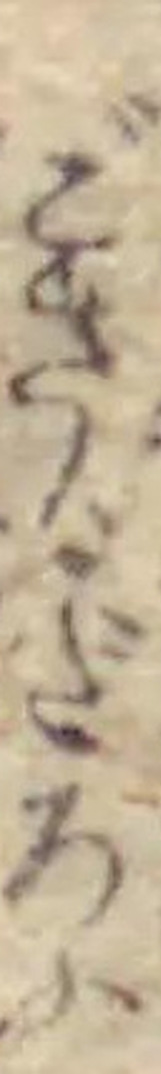ござるだろふ
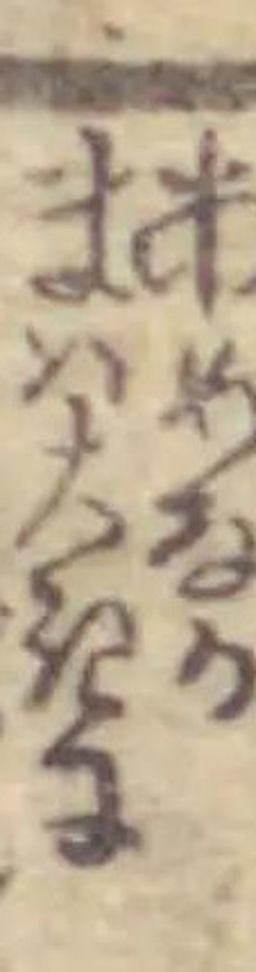まは大きに
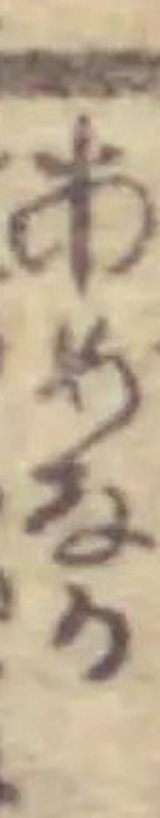あめなか
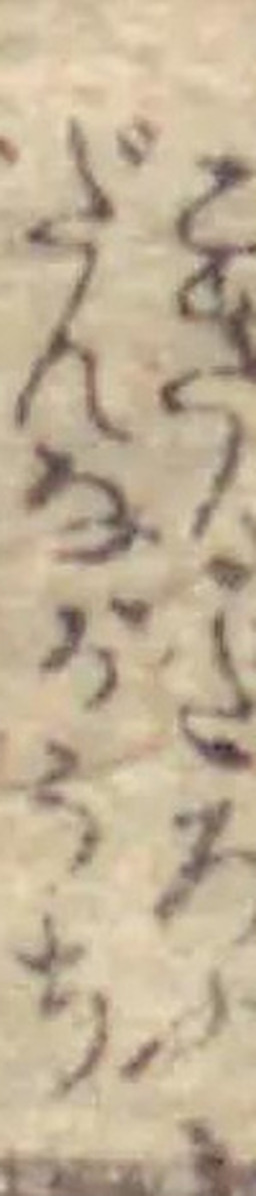だんながうち
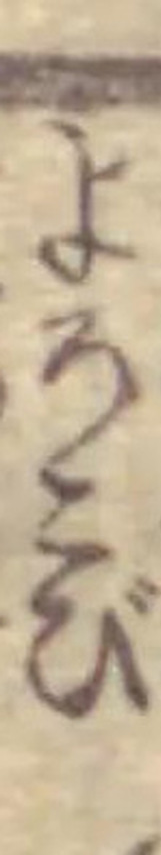よろこび
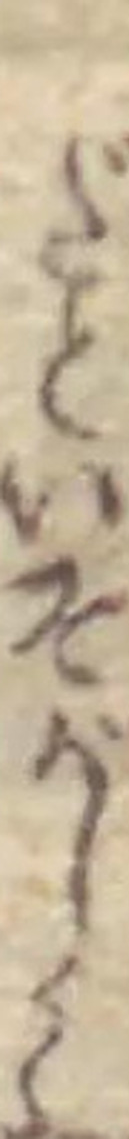だといそがしく
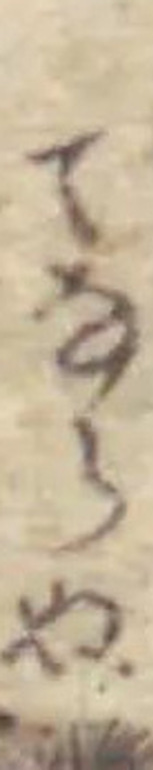てならぬ
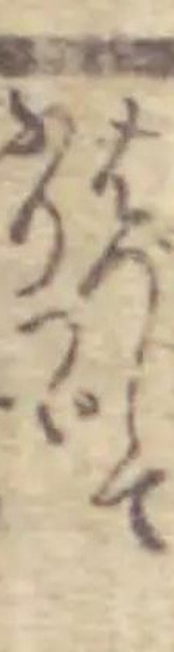ふりつゞ
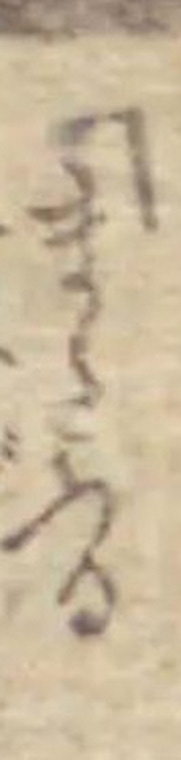〽またふる
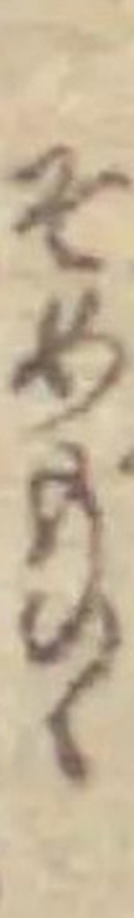そめものゝ
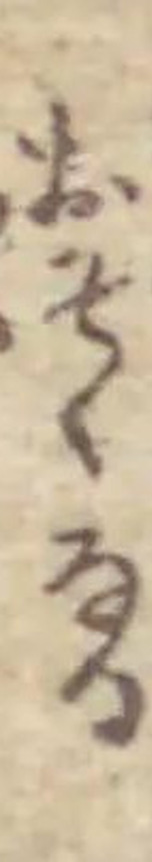おそくなる
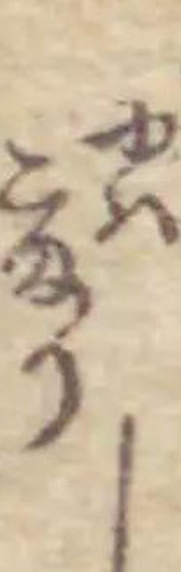こまり
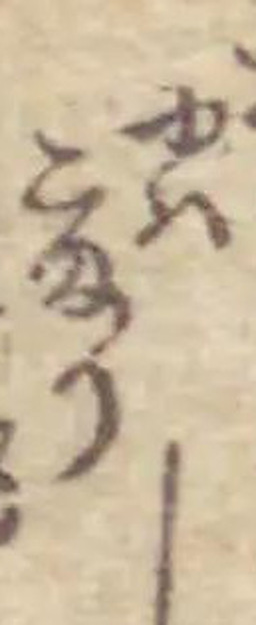こまり
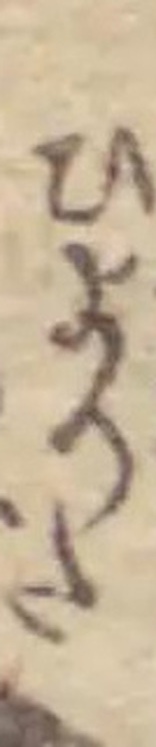ひよりた
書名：雨宮風宮出儘略縁記 3巻
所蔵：国立国会図書館 National Diet Library, JAPAN
